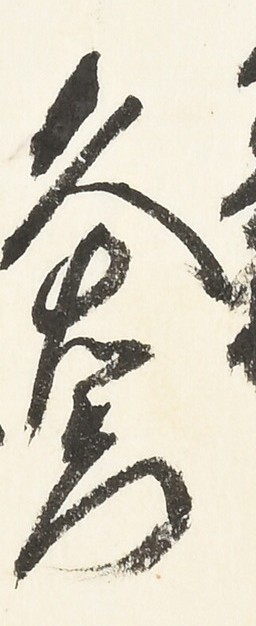茂右衛門
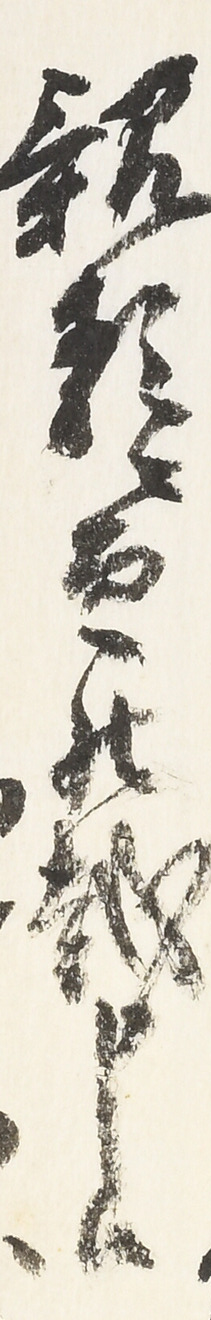親類ニ而罷越申候
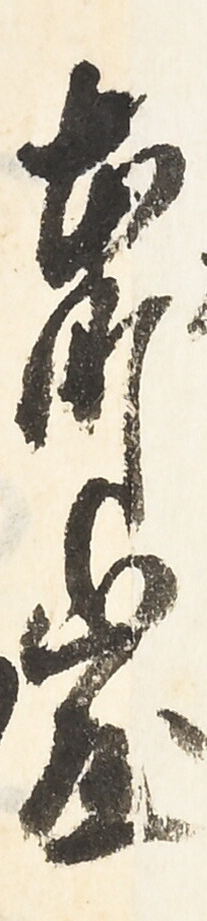本町山屋
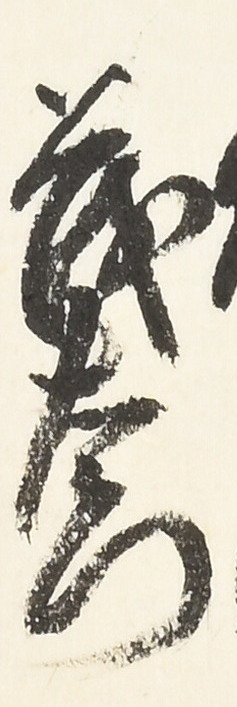茂右衛門
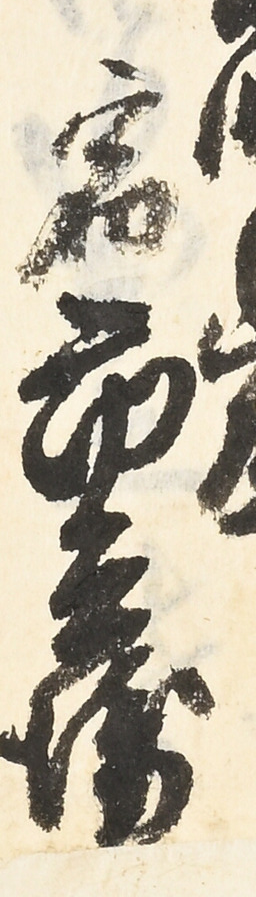宿市兵衛
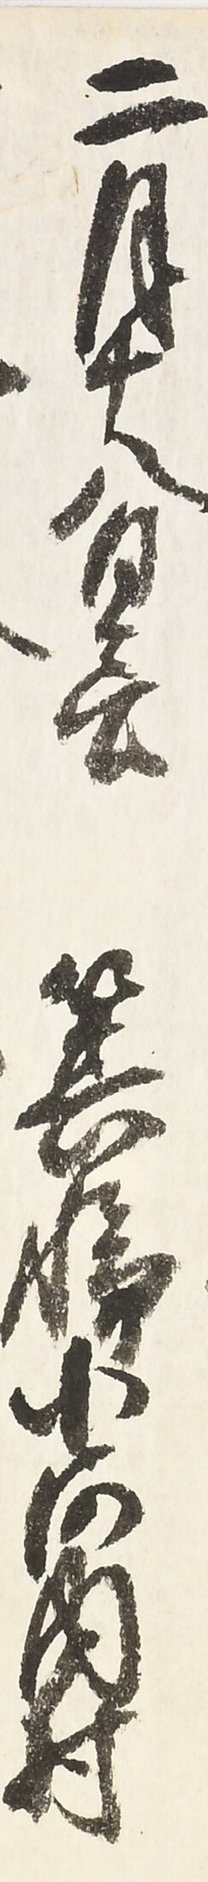二月十八日着箕輪小河内村
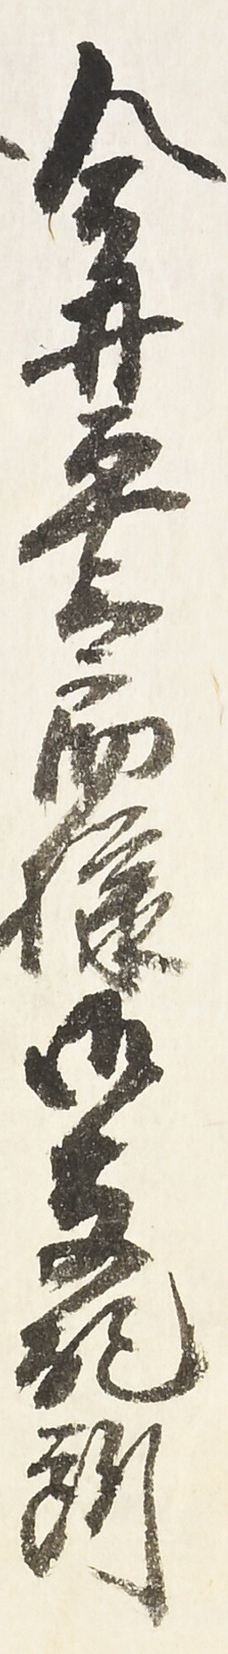今井平三郎様御支配所
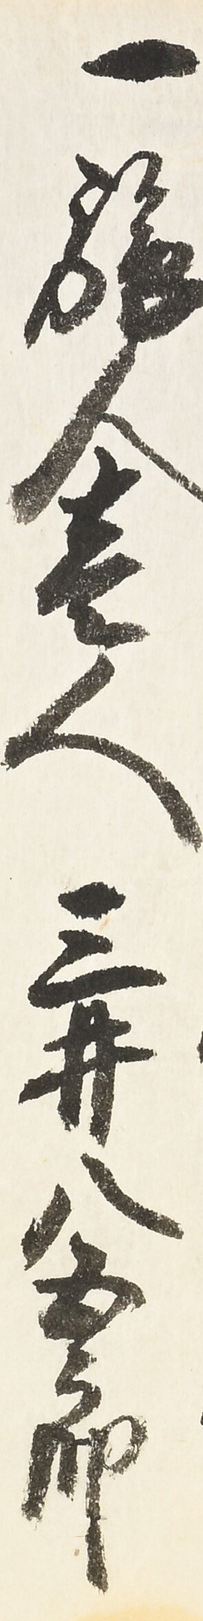一旅人壱人三井八五郎
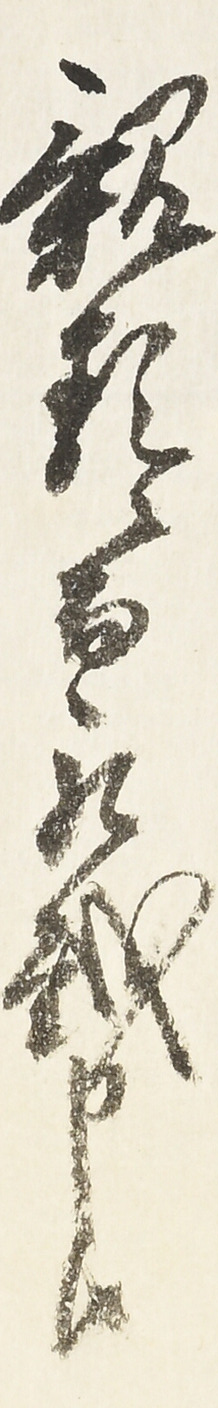親類ニ而罷越申候
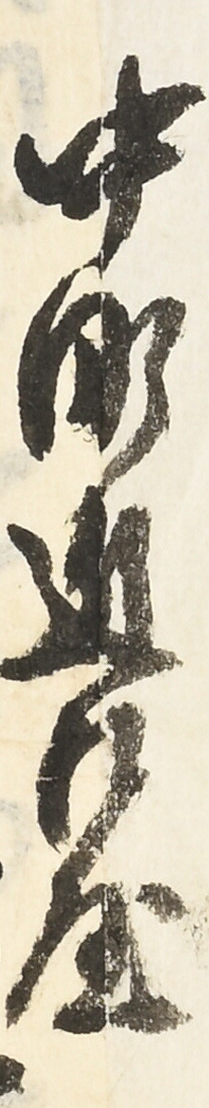中町近江屋
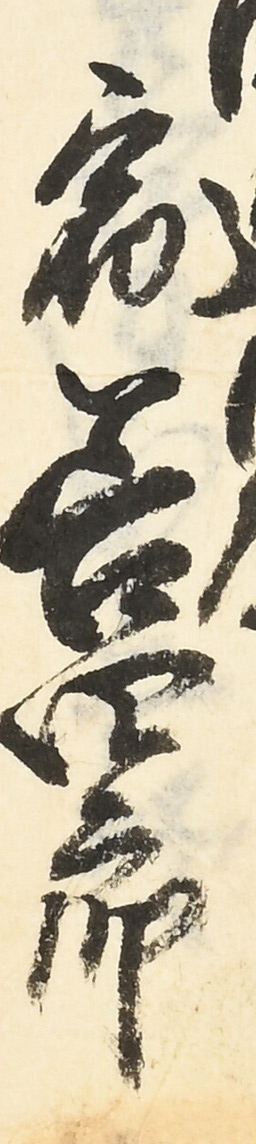宿善四郎
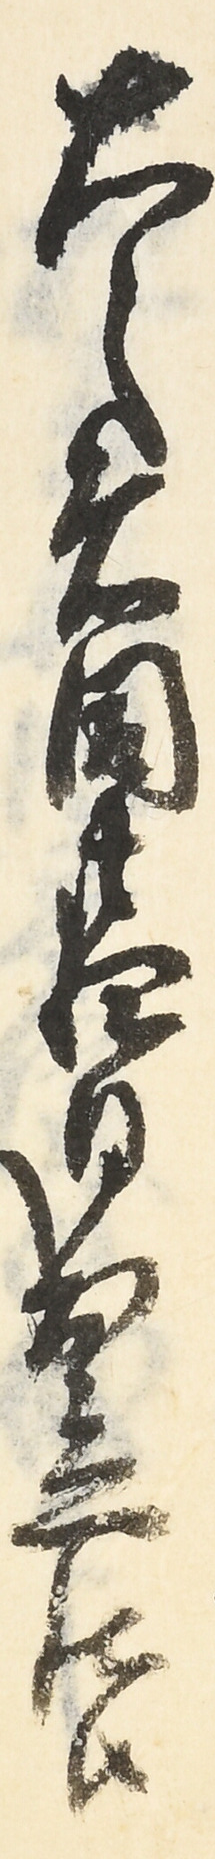右之者廿四日出立仕候
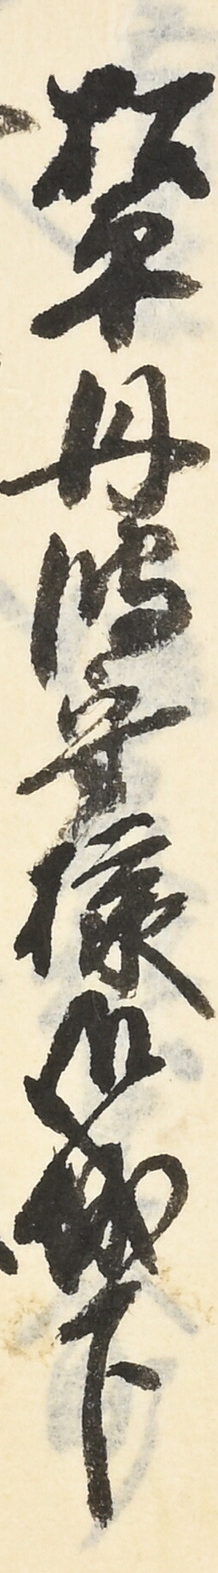松平丹波守様御城下
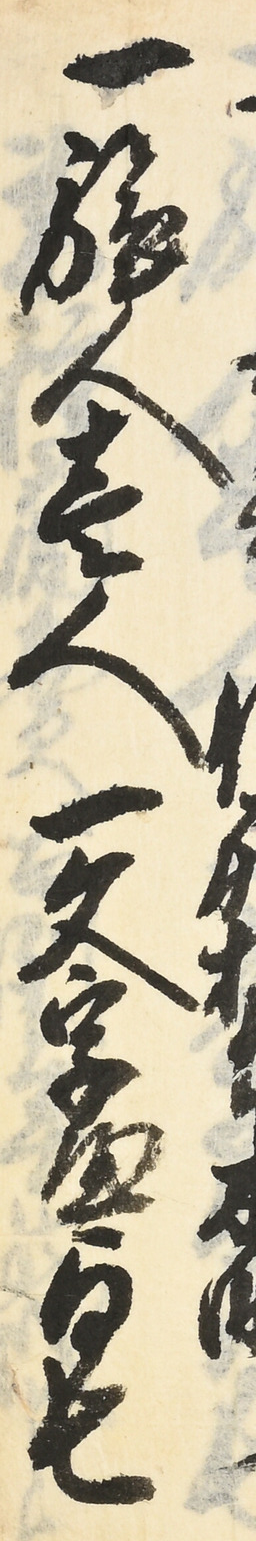一旅人壱人一文字屋与七
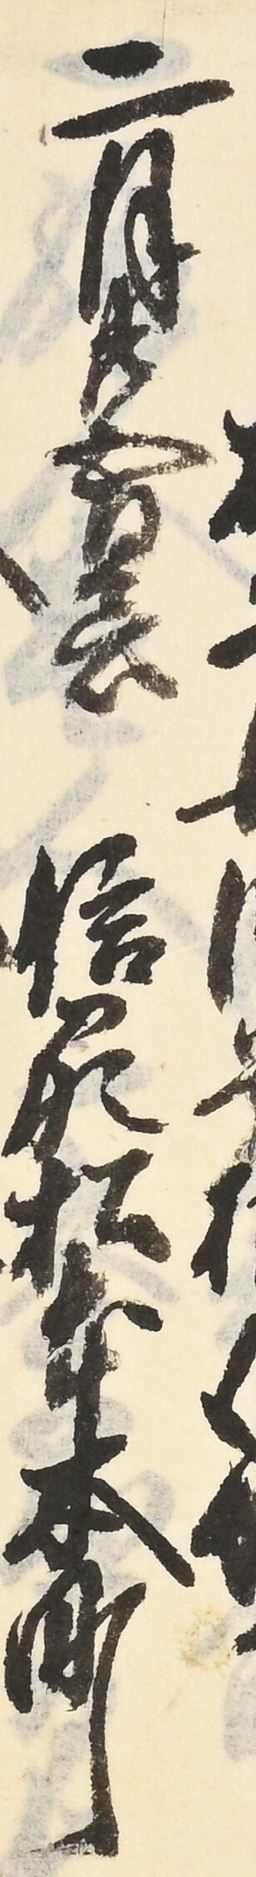弐月廿五日着信州松本本町
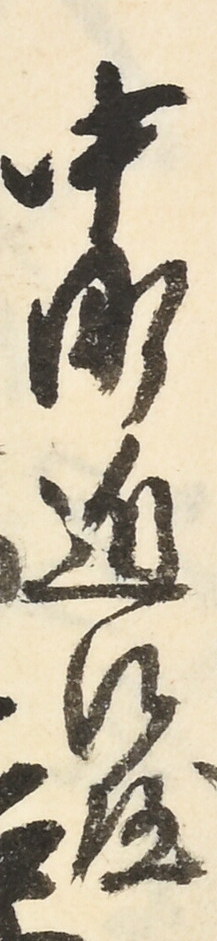中町近江屋
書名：町中旅人泊控帳
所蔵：伊那市立高遠町図書館・合同会社AMANE
